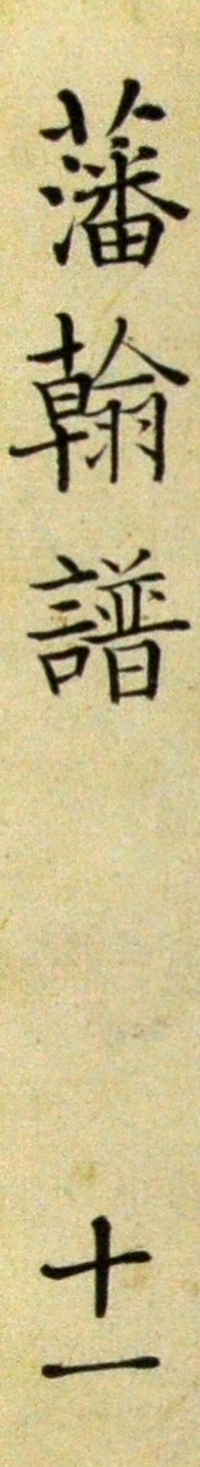藩翰譜十一
